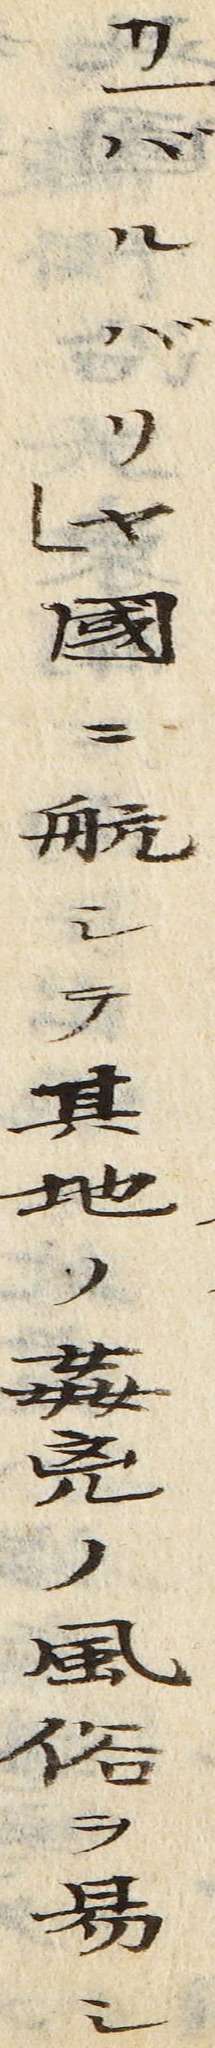リ「バルバリヤ」国ニ航シテ其地ノ姦兇ノ風俗ヲ易シ
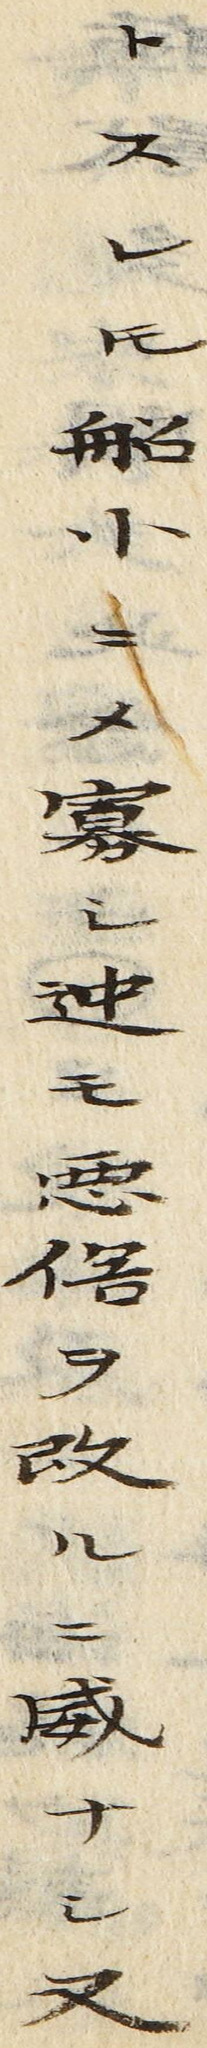トスレトモ船小ニシテ寡シ迚モ悪俗ヲ改ルニ威ナシ又

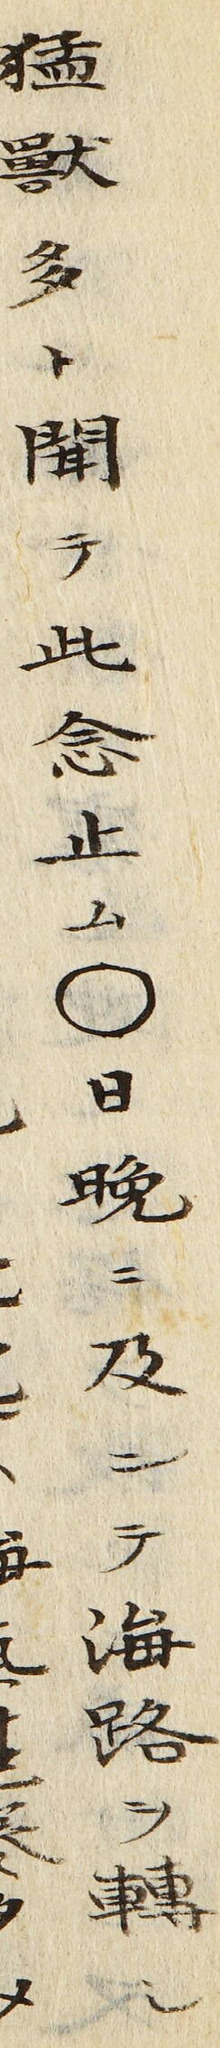猛獣多ト聞テ此念止ム○日晩ニ及ンテ海路ヲ転シ
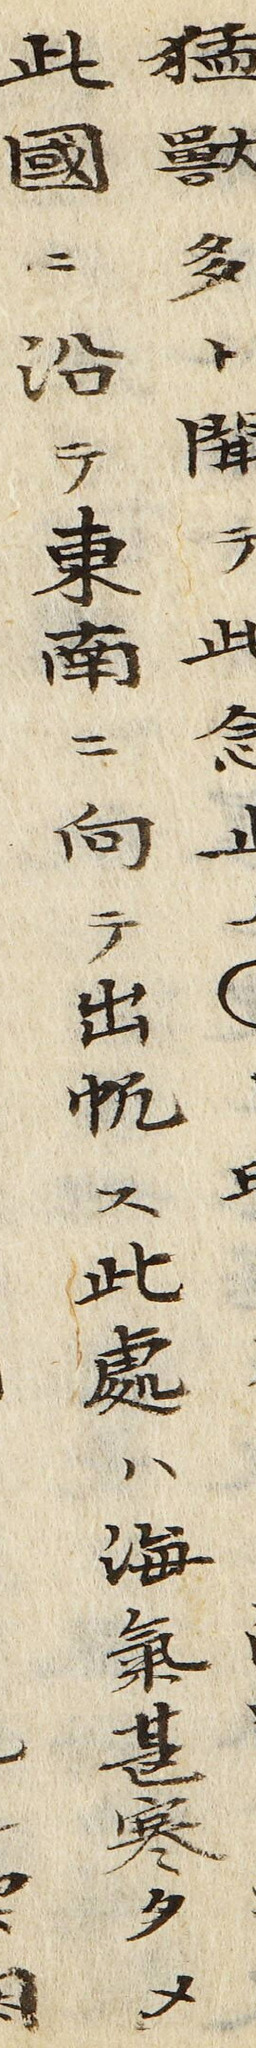此国ニ沿テ東南ニ向テ出帆ス此処ハ海気甚寒クシテ
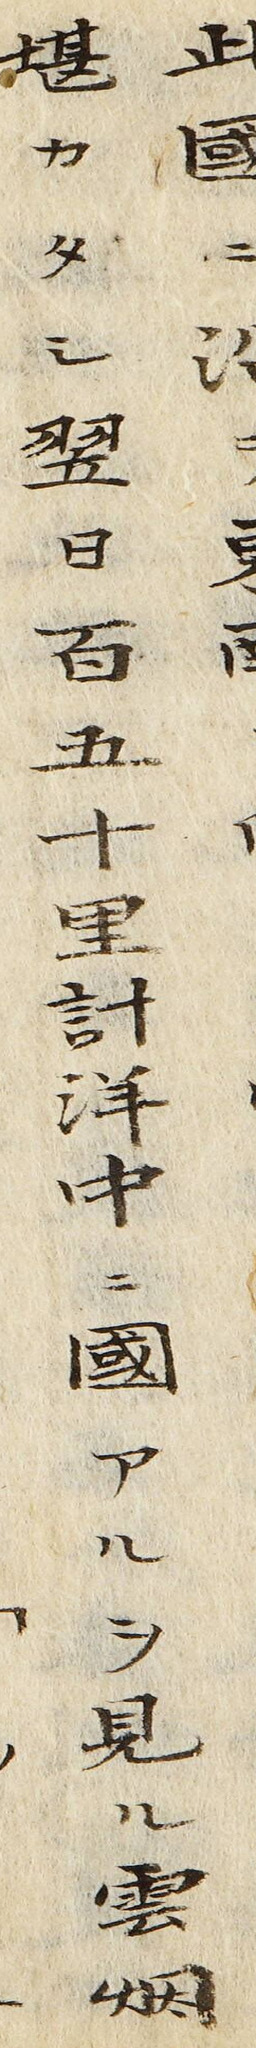堪カタシ翌日百五十里計洋中ニ国アルヲ見ル雲烟
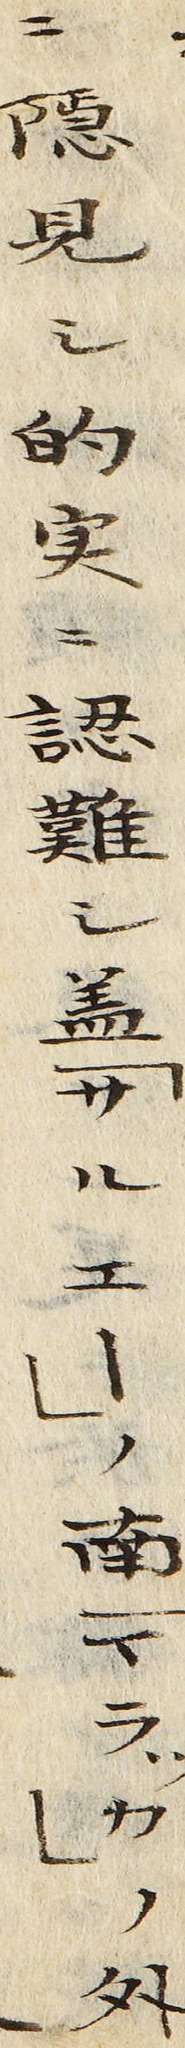ニ隠見シ的実ニ認難シ蓋「サルエー」ノ南「マラツカ」ノ外
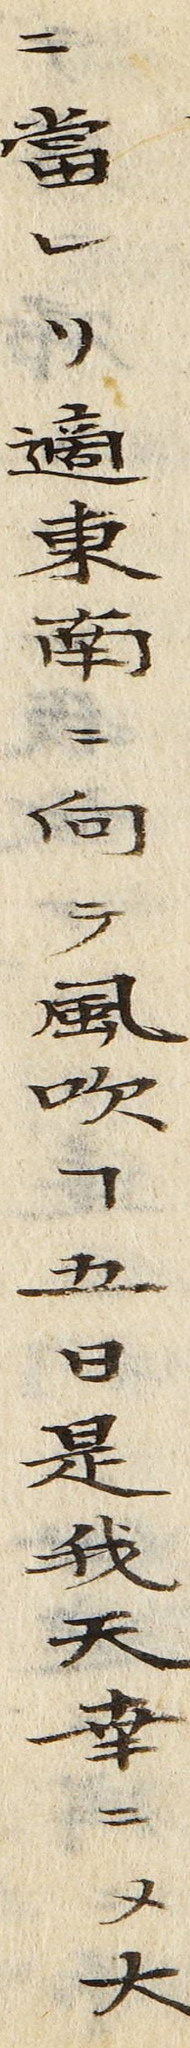ニ当レリ適東南ニ向テ風吹コト五日是我天幸ニシテ大
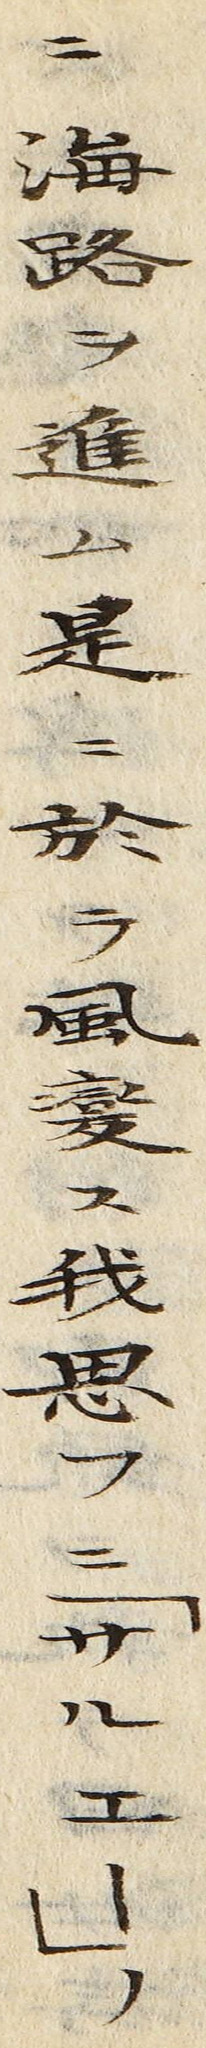ニ海路ヲ進ム是ニ於テ風変ス我思フニ「サルエー」ノ
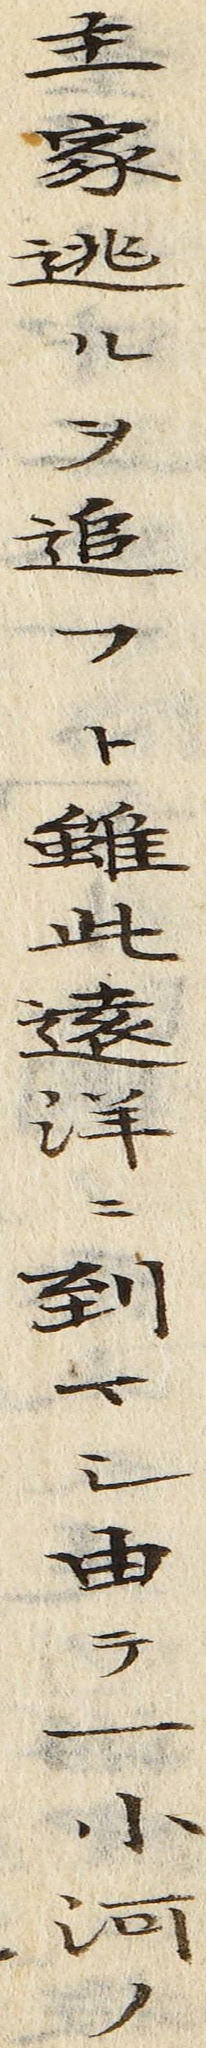主家逃ルヲ追フト雖此遠洋ニ到マシ由テ一小河ノ
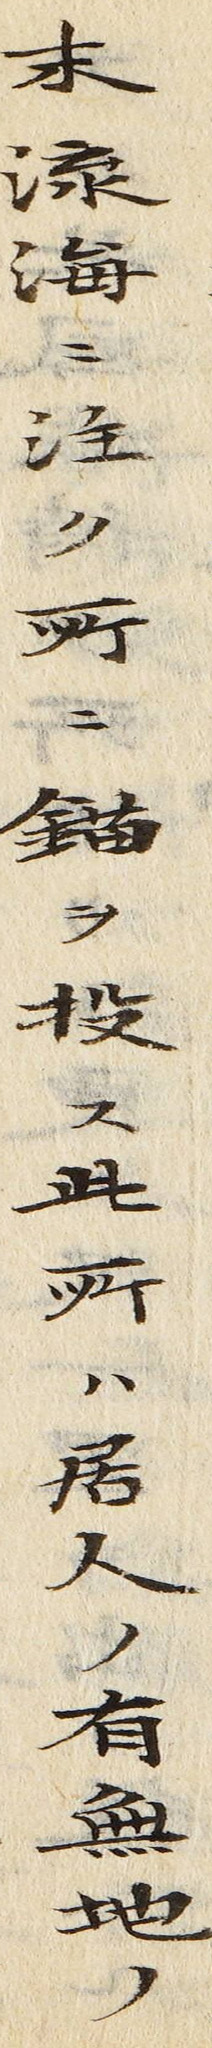末漾海ニ注ク所ニ錨ヲ投ス此所ハ居人ノ有無地ノ
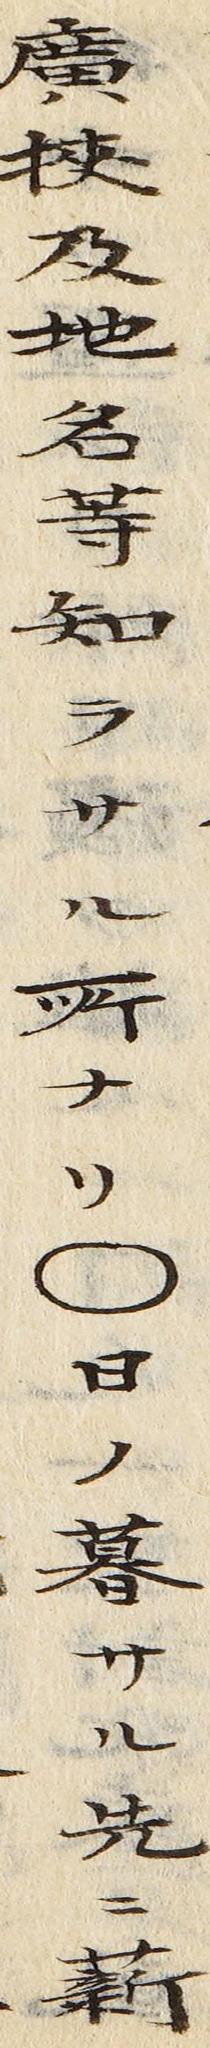広狭及地名等知ラサル所ナリ○日ノ暮サル先ニ薪
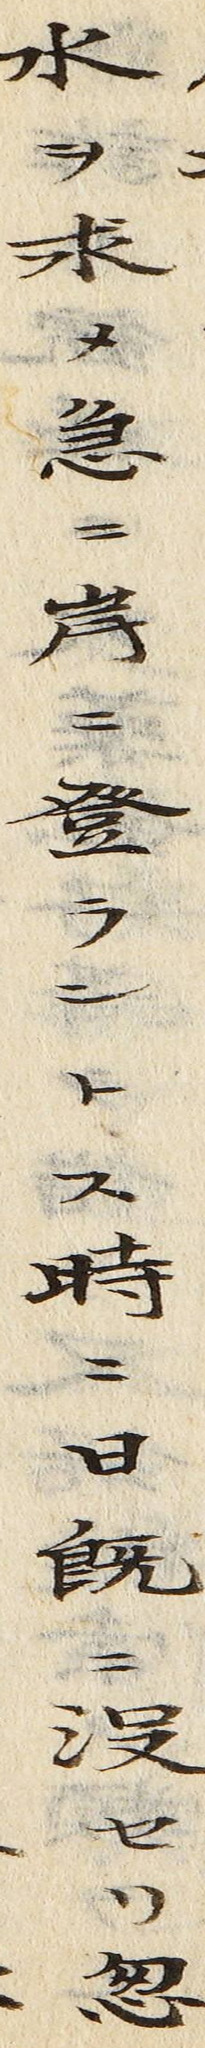水ヲ求メ急ニ岸ニ登ラントス時ニ日既ニ没セリ忽
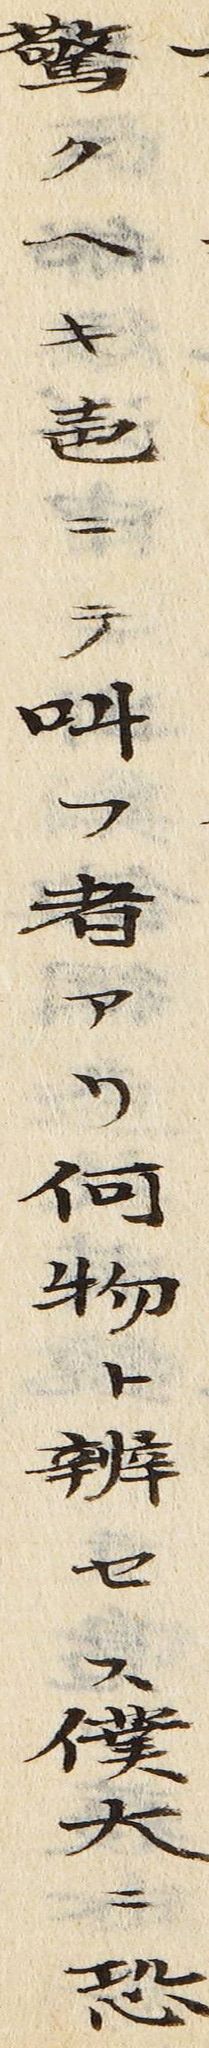驚クヘキ声ニテ叫フ者アリ何物ト弁セス僕大ニ恐
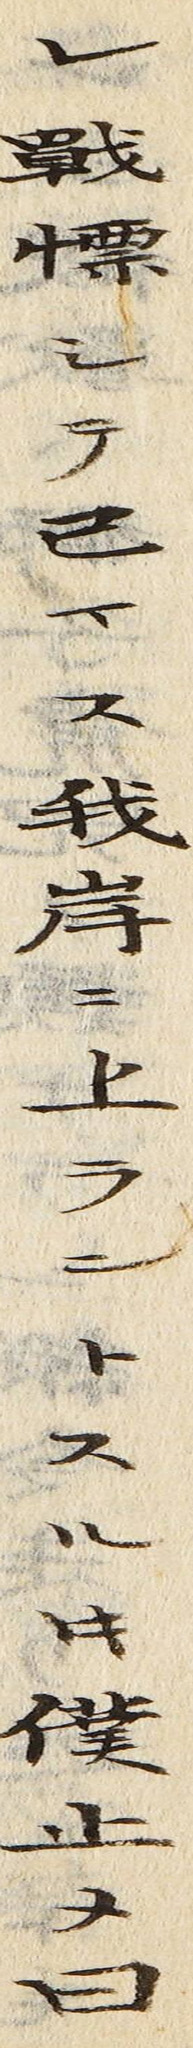レ戦慄シテ已マス我岸ニ上ラントスルトキ僕止シテ曰
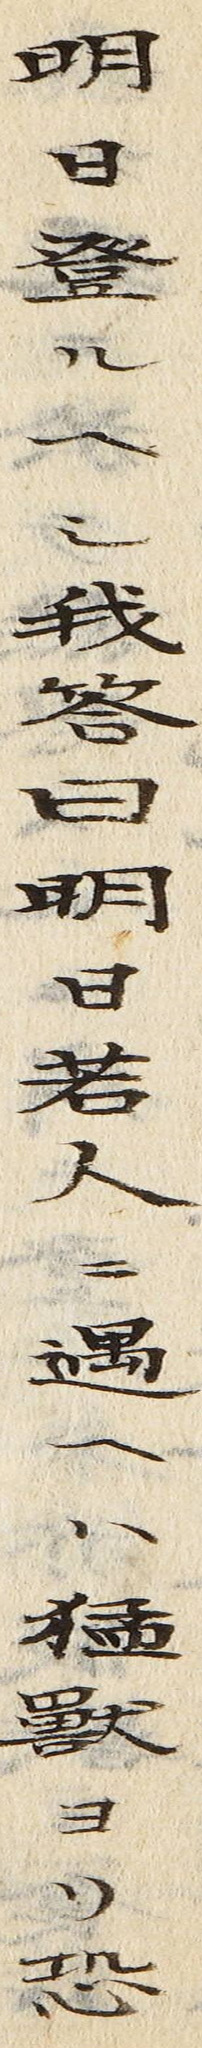明日登ルヘシ我答曰明日若人ニ遇ヘハ猛獣ヨリ恐
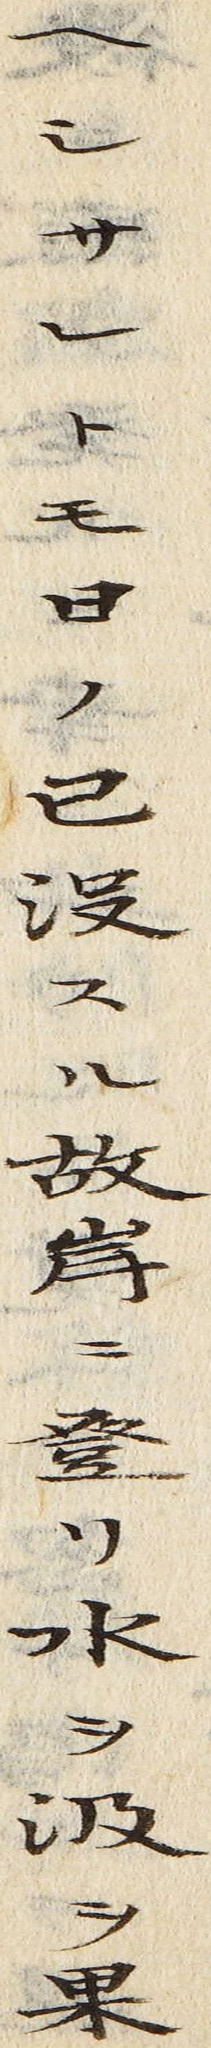ヘシサレトモ日ノ已没スル故岸ニ登リ水ヲ汲ヲ果
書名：漂流紀事
